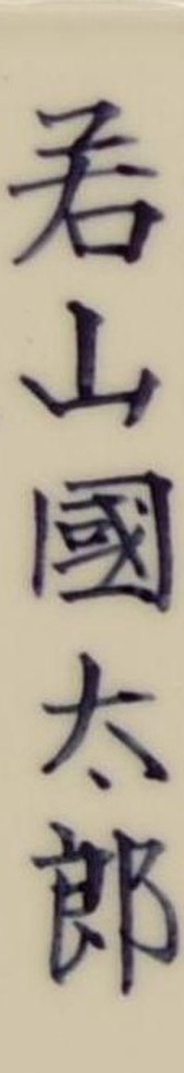若山國太郎
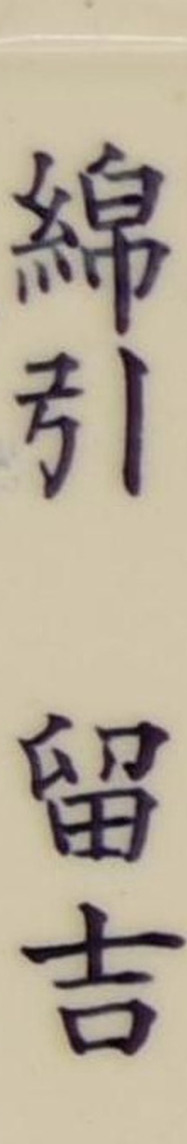綿引留吉
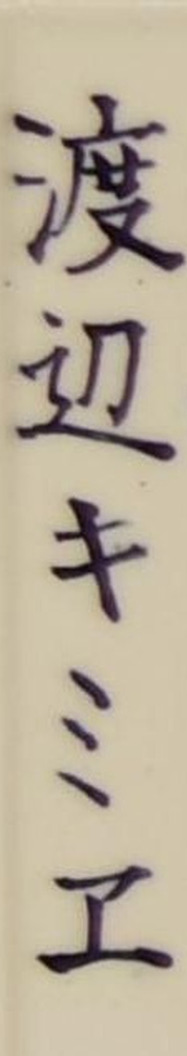渡辺キミヱ

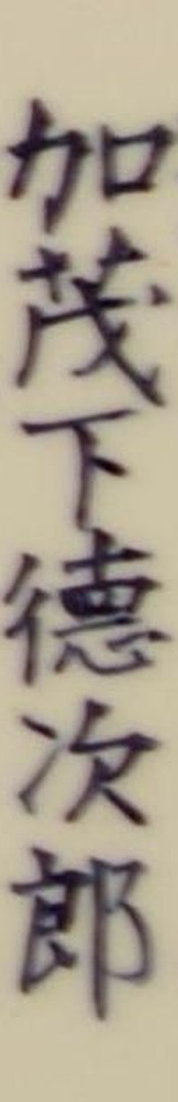加茂下徳次郎
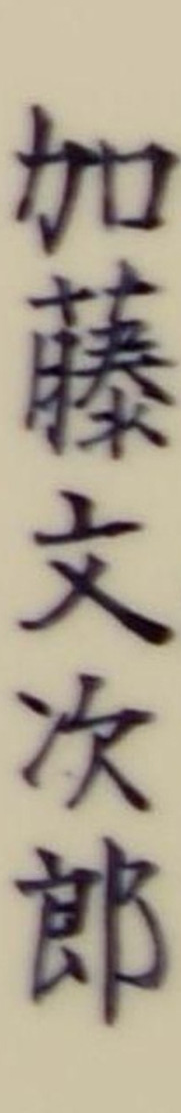加藤文次郎
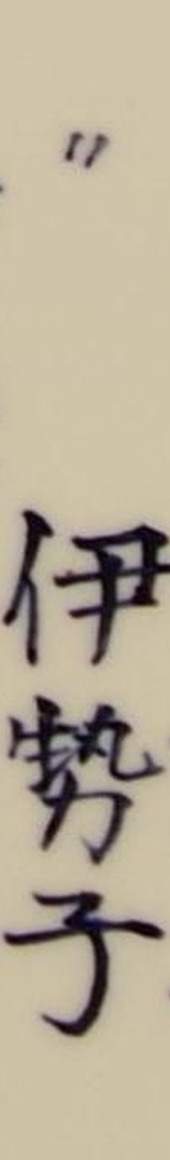伊勢子
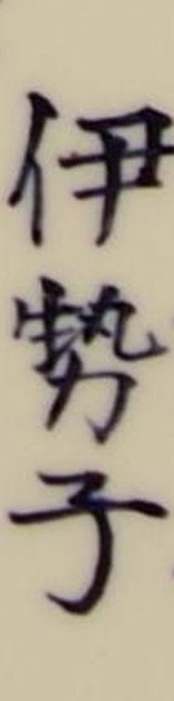伊勢子
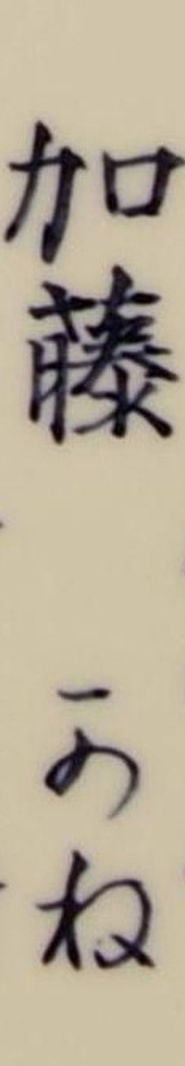加藤かね
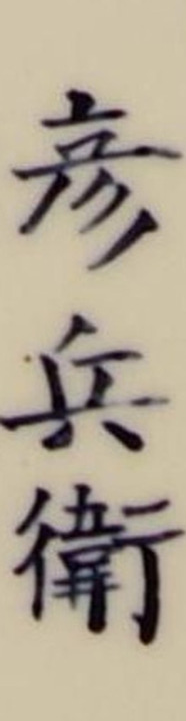彦兵衛
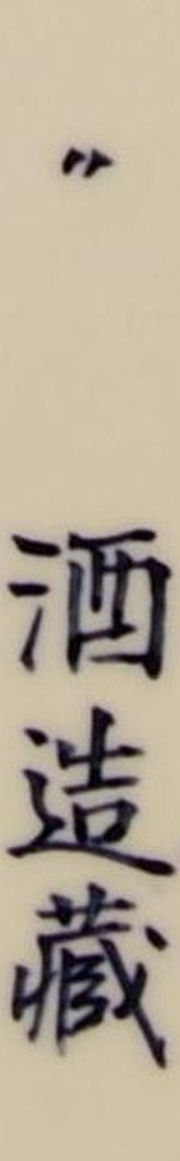酒造蔵
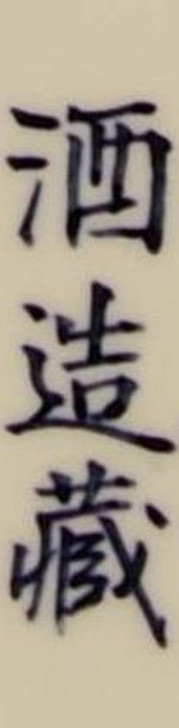酒造蔵
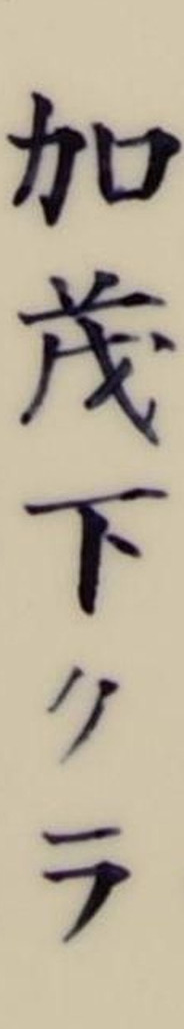加茂下クラ
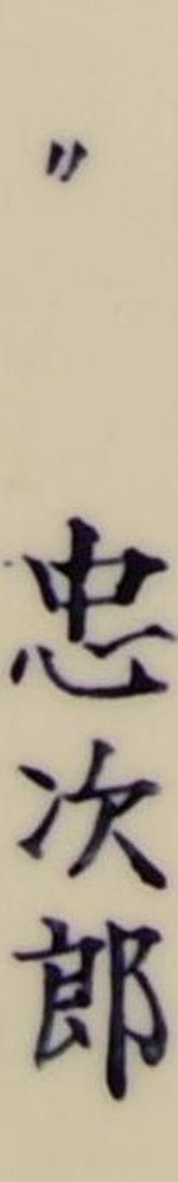忠次郎
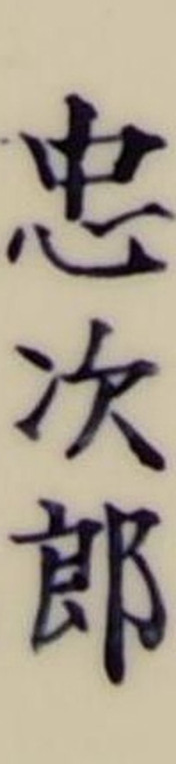忠次郎
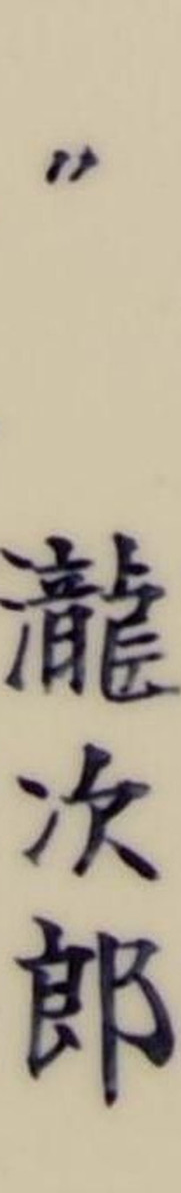瀧次郎
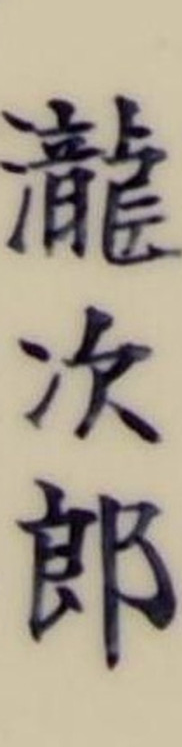瀧次郎
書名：E~L
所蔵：高野山金剛峯寺
